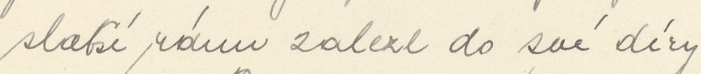slabší ránu zalezl do své díry.
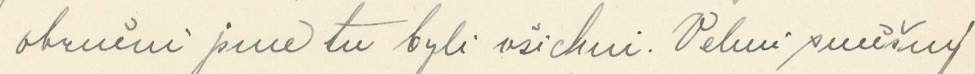obrněni jsme tu byli všichni. Velmi směšný
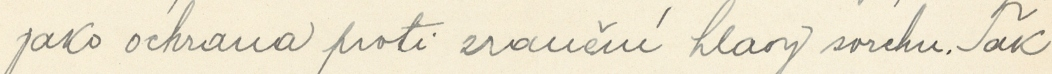jako ochrana proti zranění hlavy svrchu. Tak
